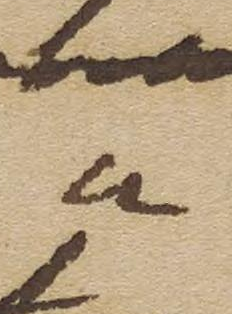a
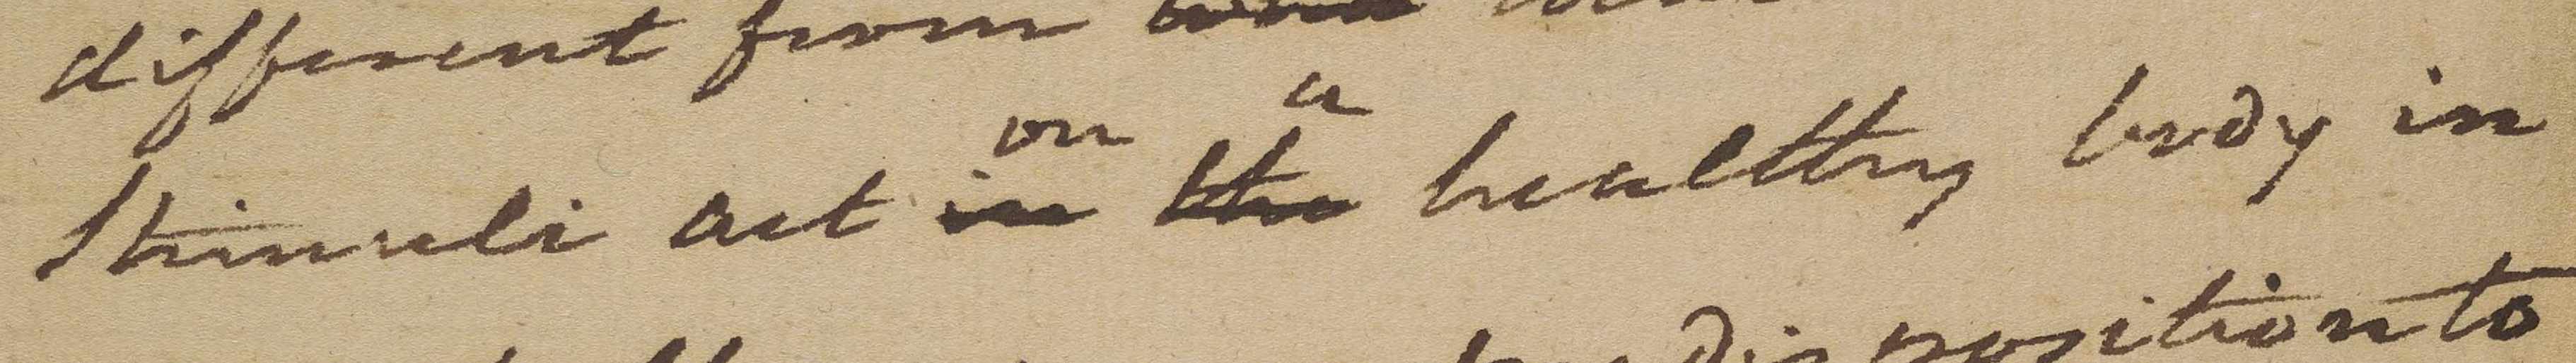stimuli act [in] [the] healthy body in
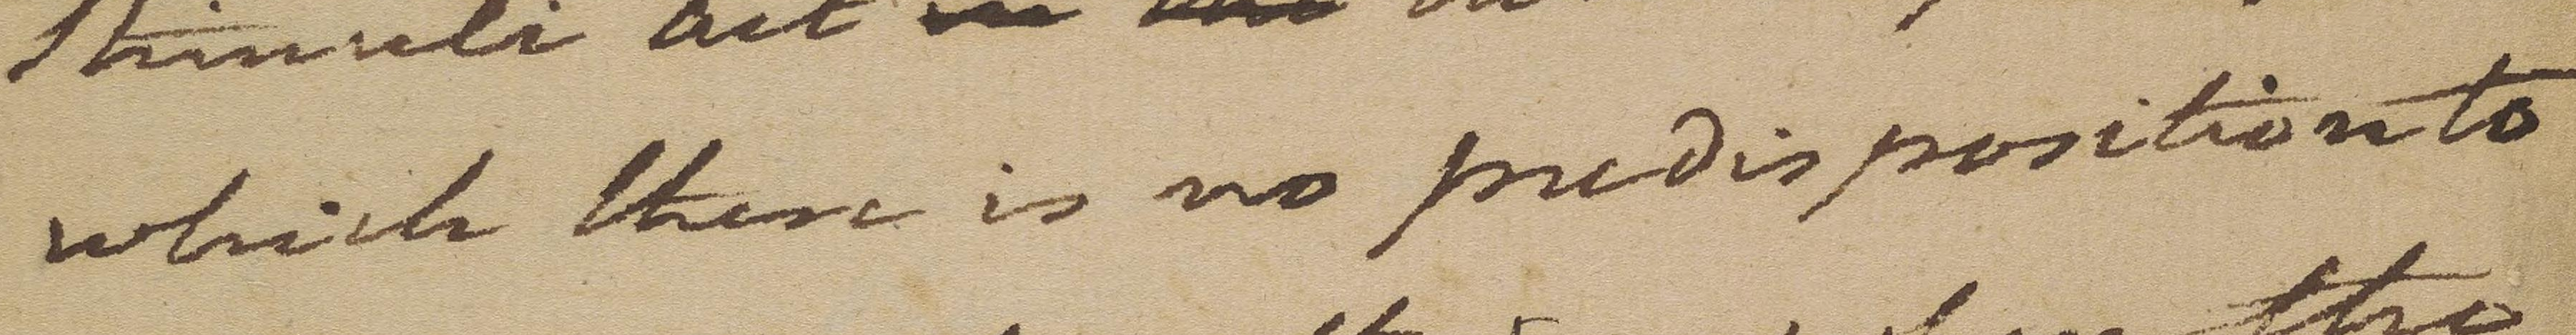which there is no predisposition to
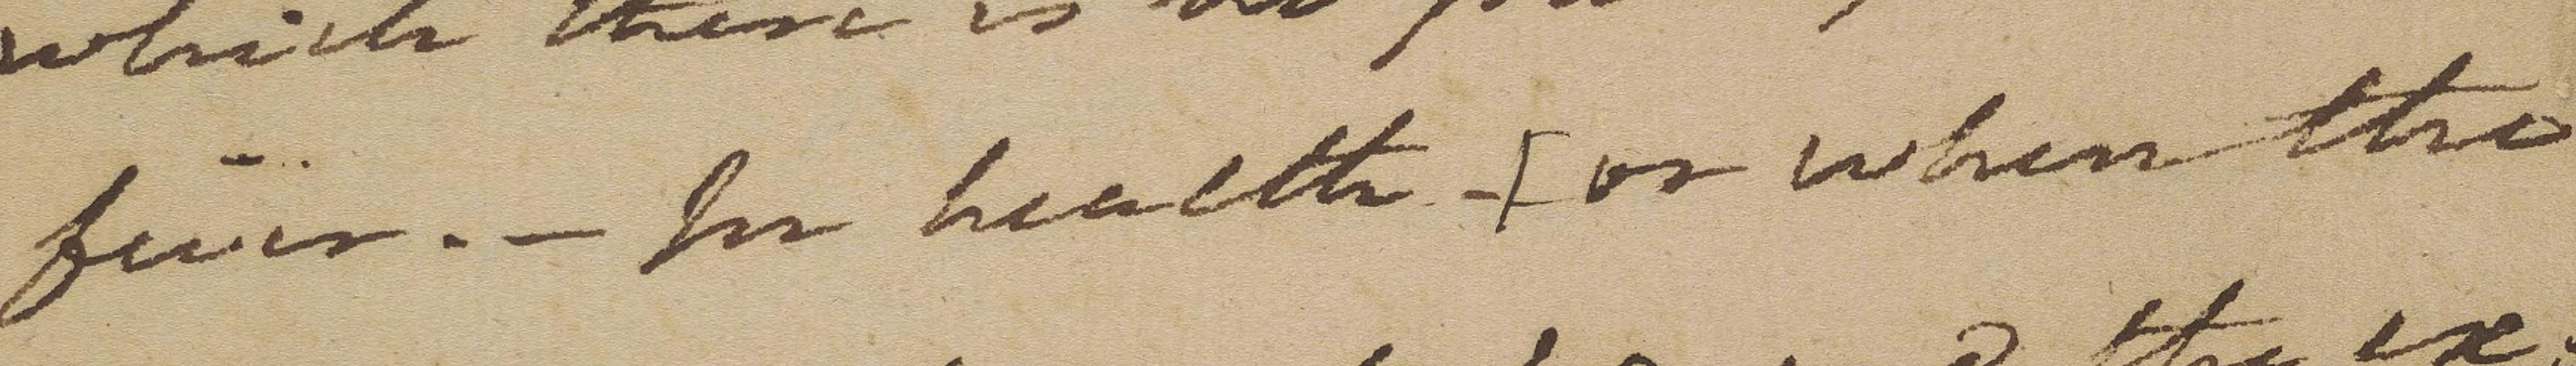fever. In health (or when the
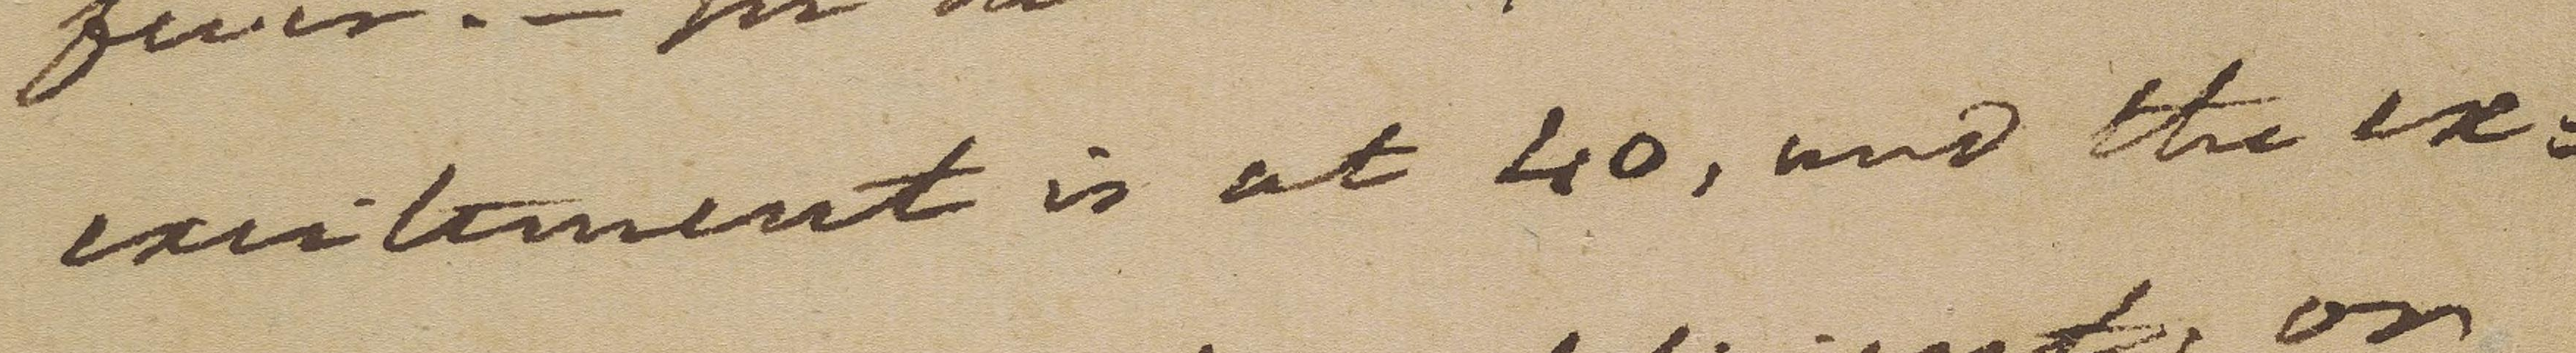excitement is at 40, and the ex-
